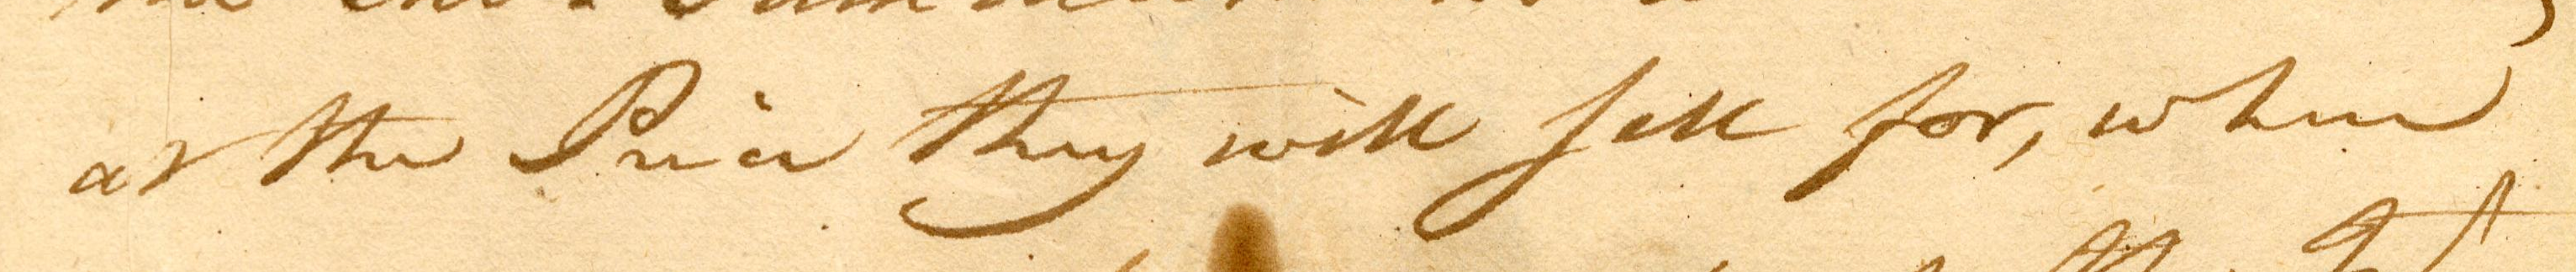as the Price they will sell for, when
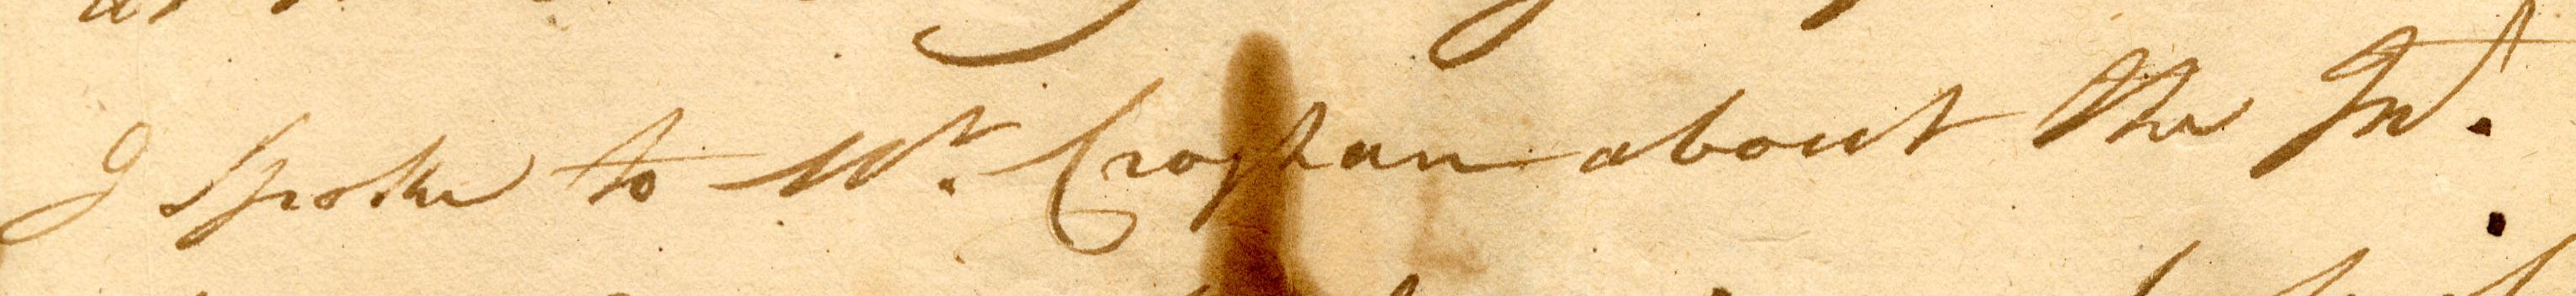I spoke to M^r. Croghan about the In^t.
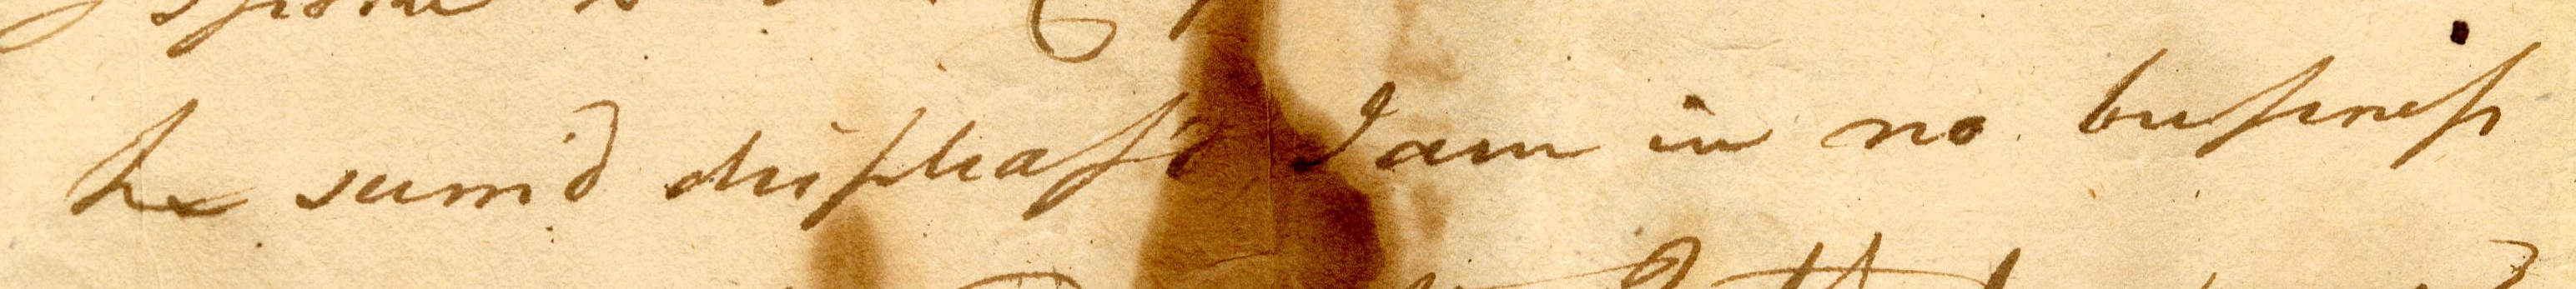he seem'd displeasd, I am in no business
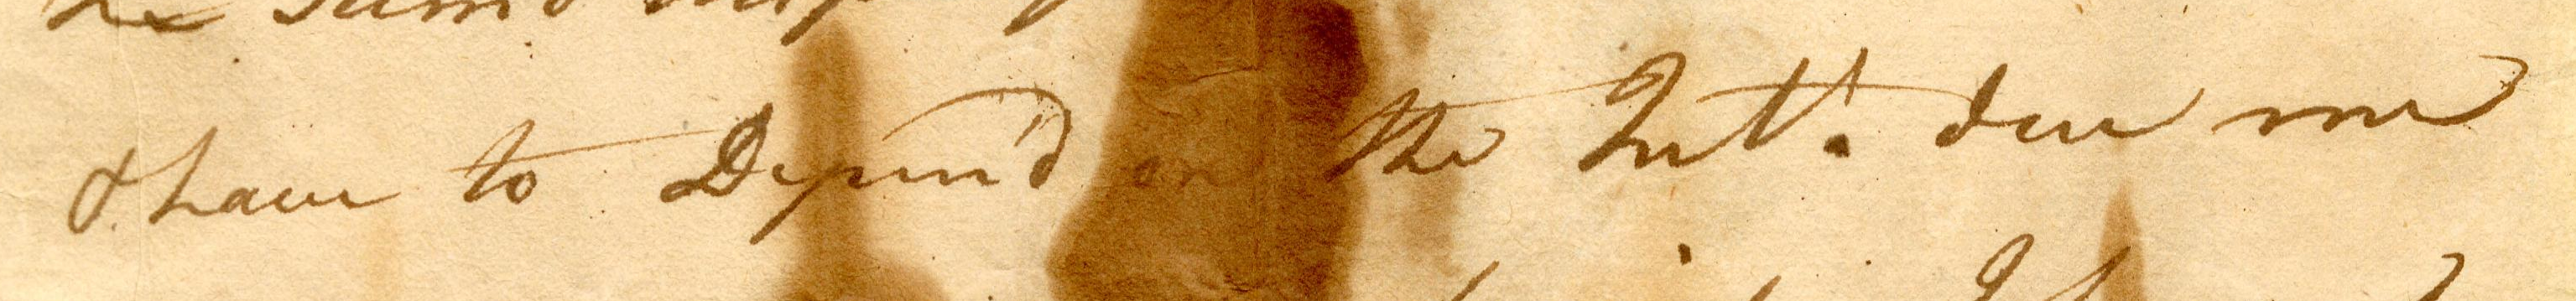& have to Depen'd- the Int^t. due me
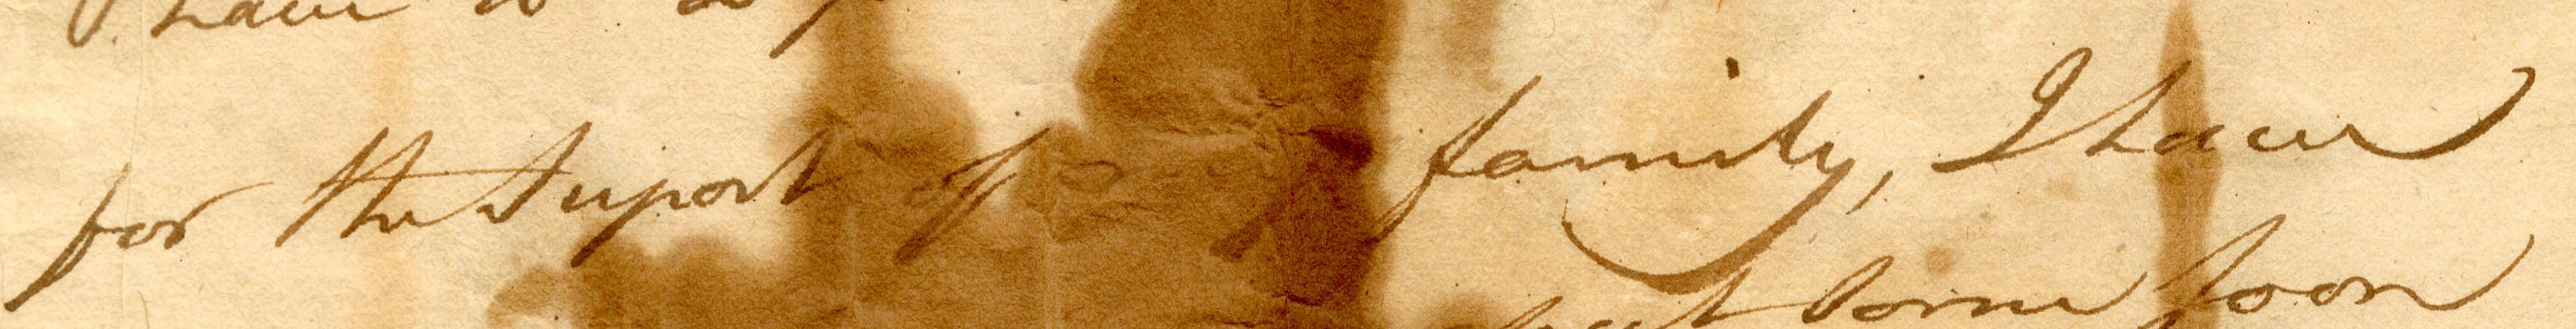for the suport of family, I have
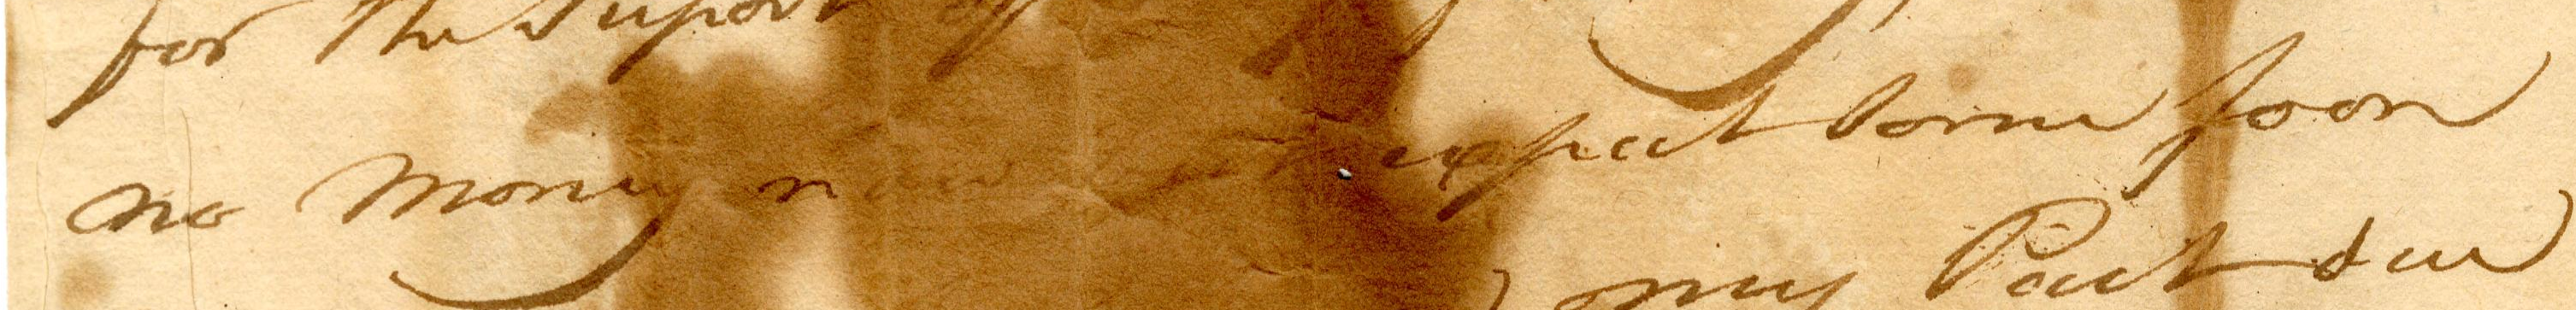no Money now I expect some soon
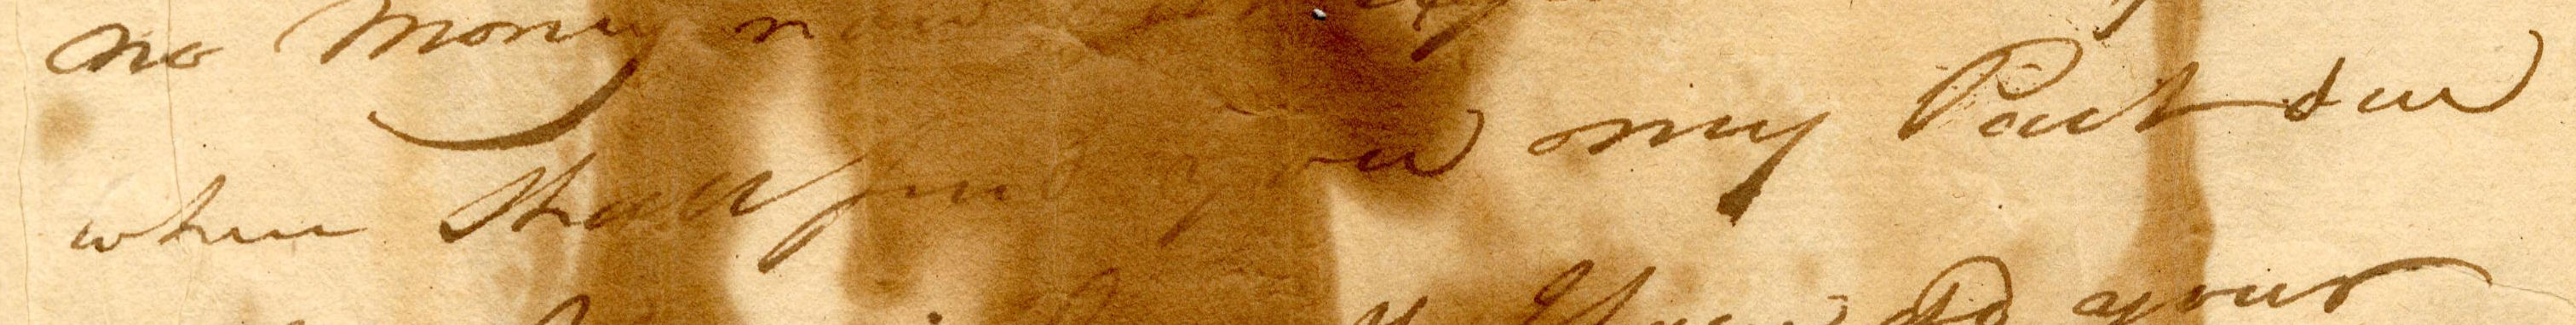when shall send you my Part due
